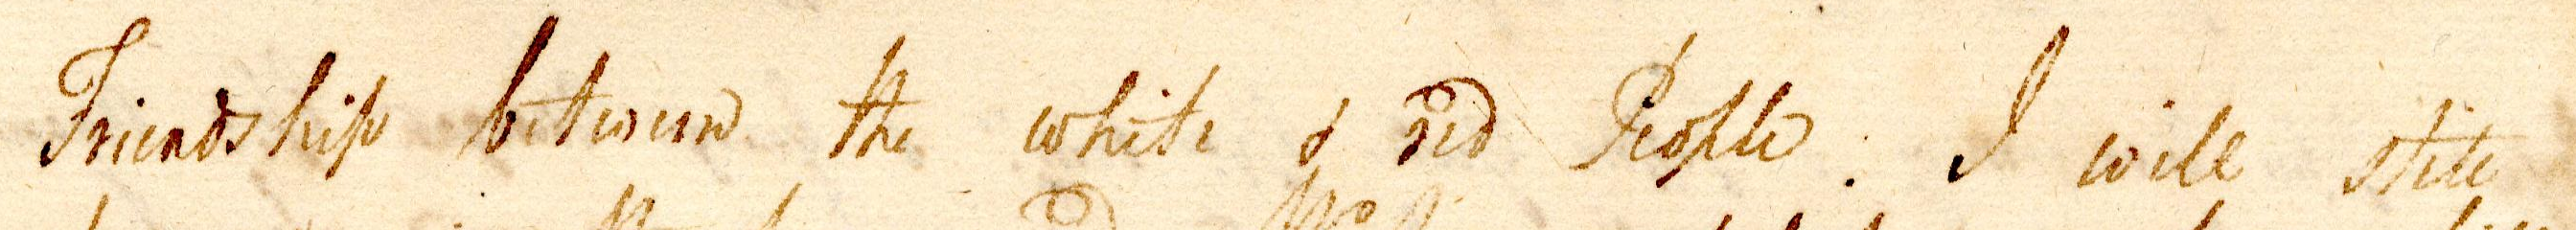Friendship between the white & red People. I will still
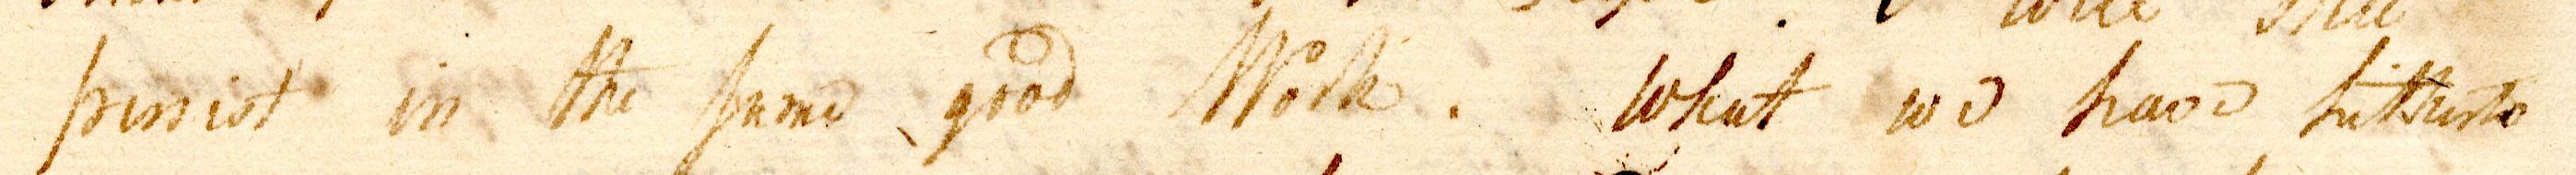persist in the same good Work. What we have hither to
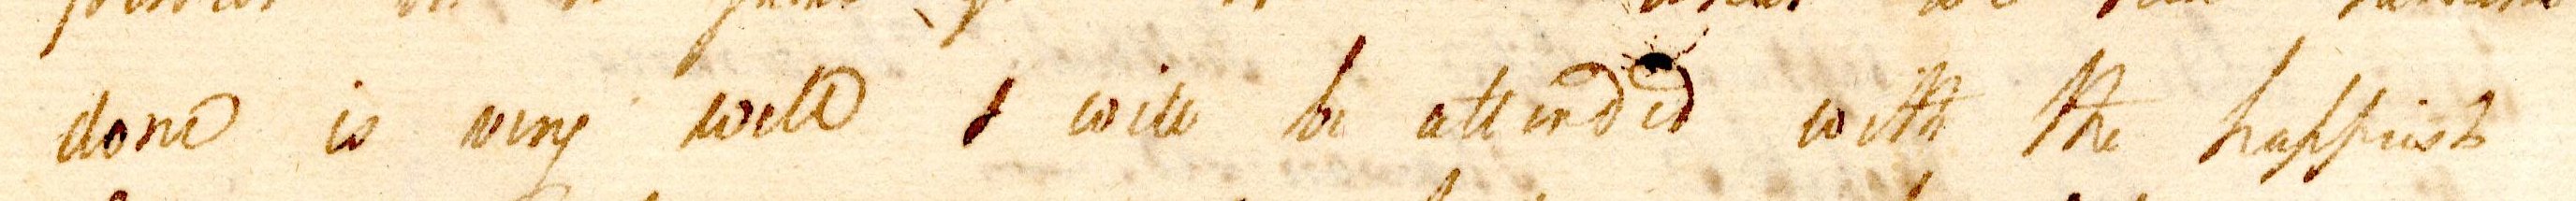done is very well & will be attended with the happiest
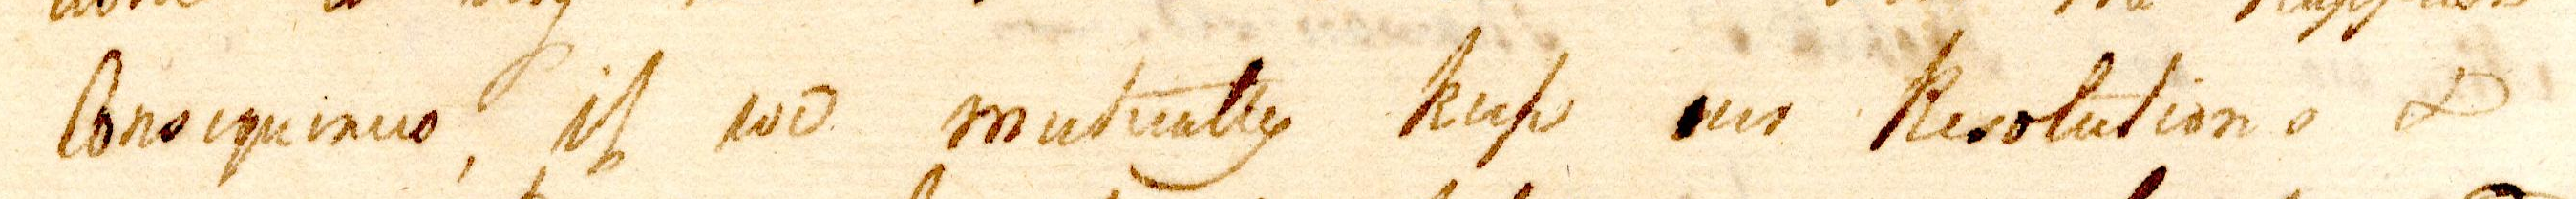Consequences, if we mutually keep our Resolutions &
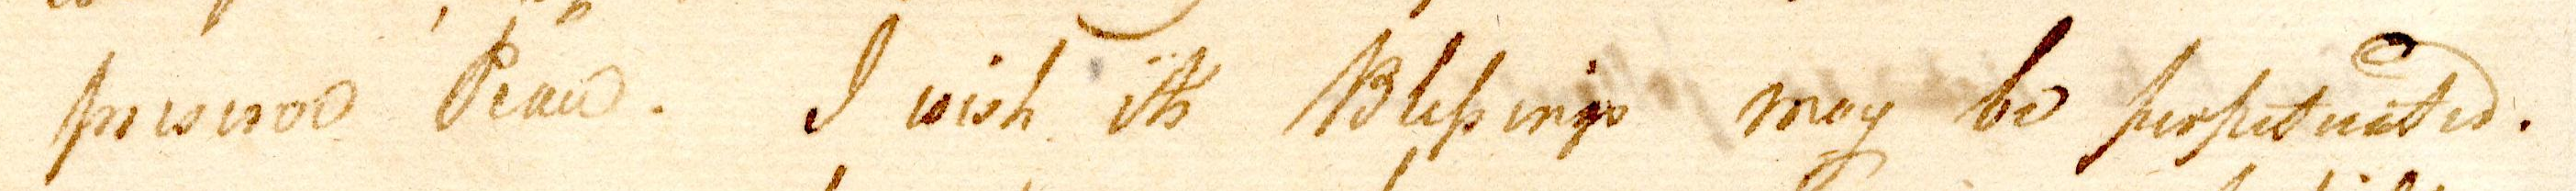preserve Peace. I wish its Blessings may be perpetuated.
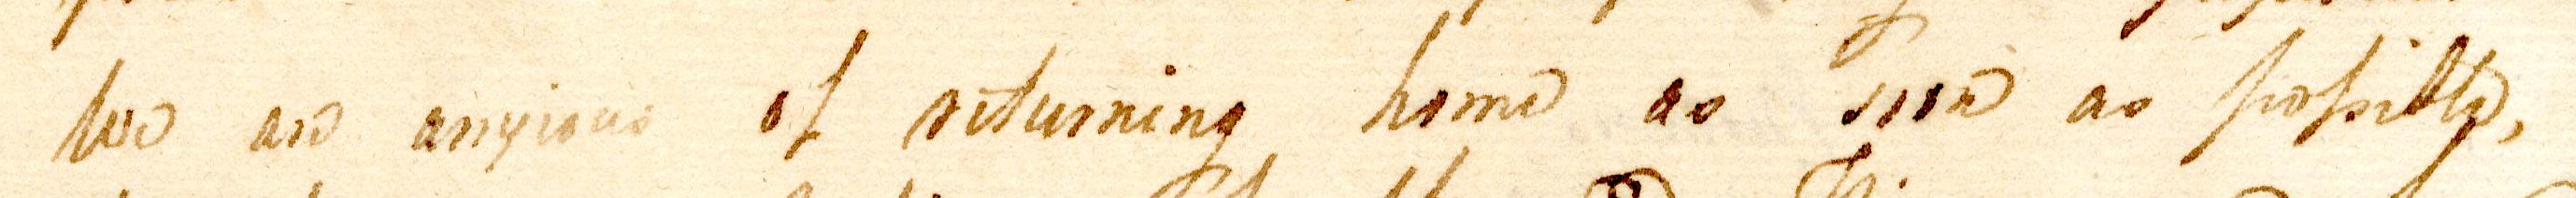We are anxious of returning home as soon as possible,
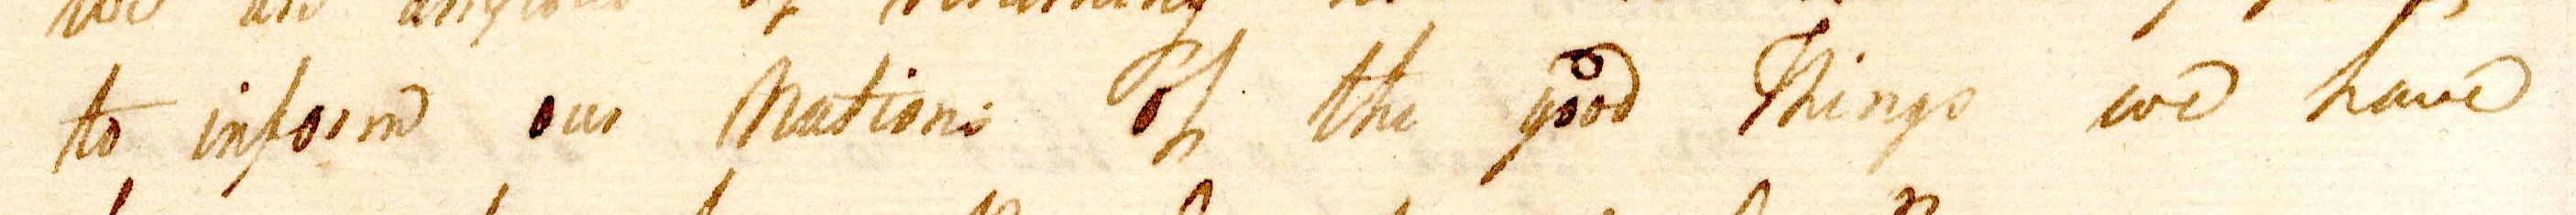to inform our Nations of the good Things we have
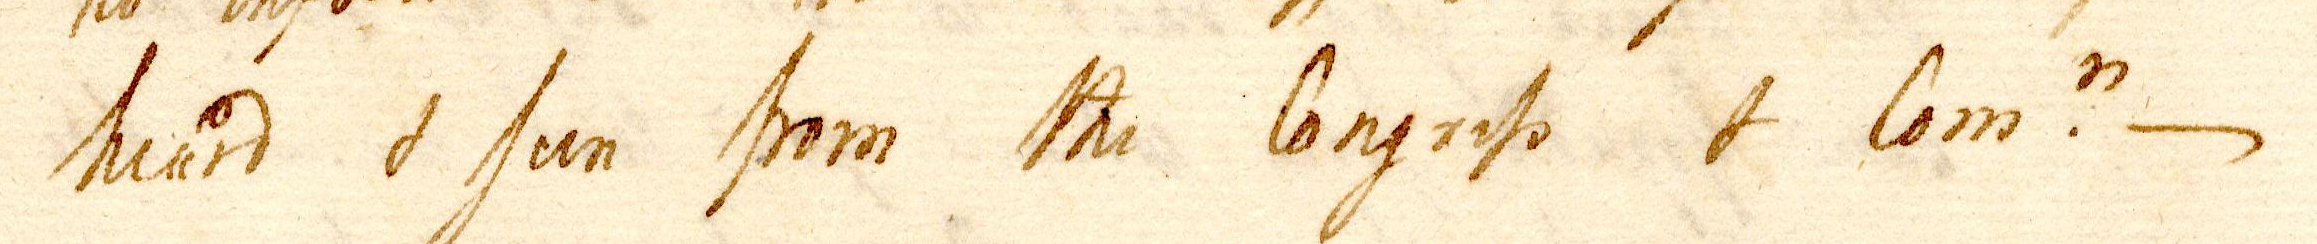heard & seen from the Congress & Com^r.-
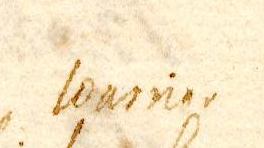Warrior
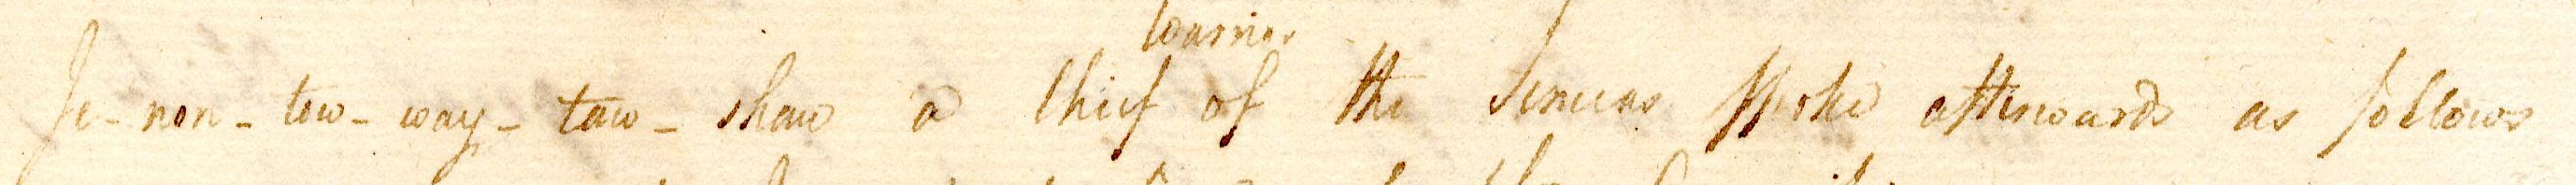Jo- non- tow- way-taw-shaw a Chief ^ of the Senecas spoke afterwards as follows
